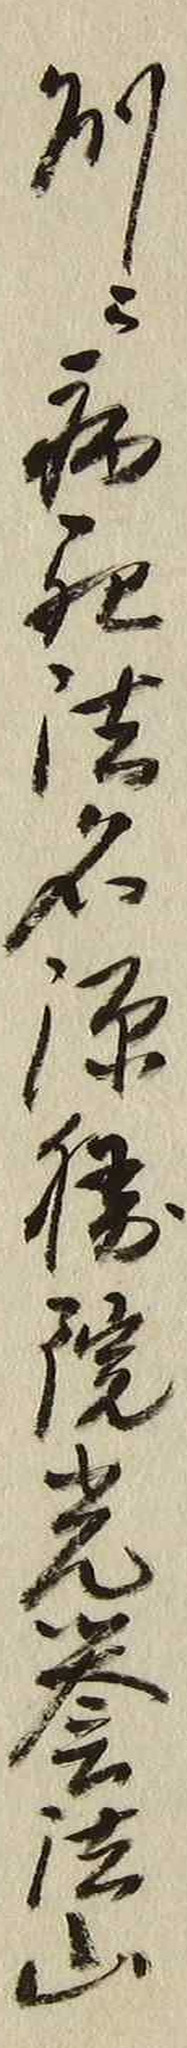州ニ病死法名源勝院光誉法山
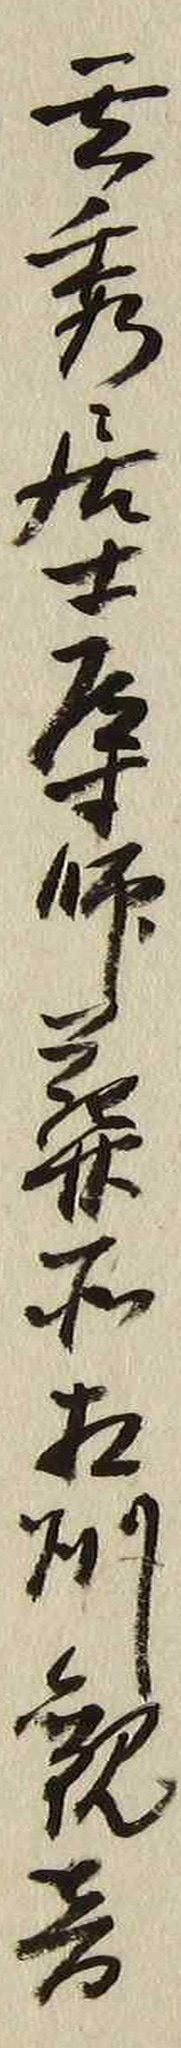玄秀居士導師葬所相州観音
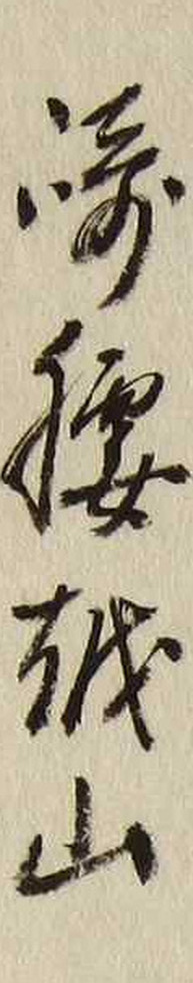崎腰越山

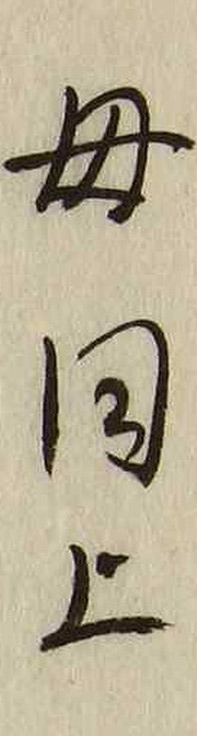母同上
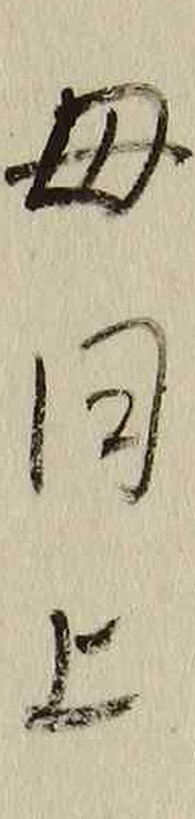母同上
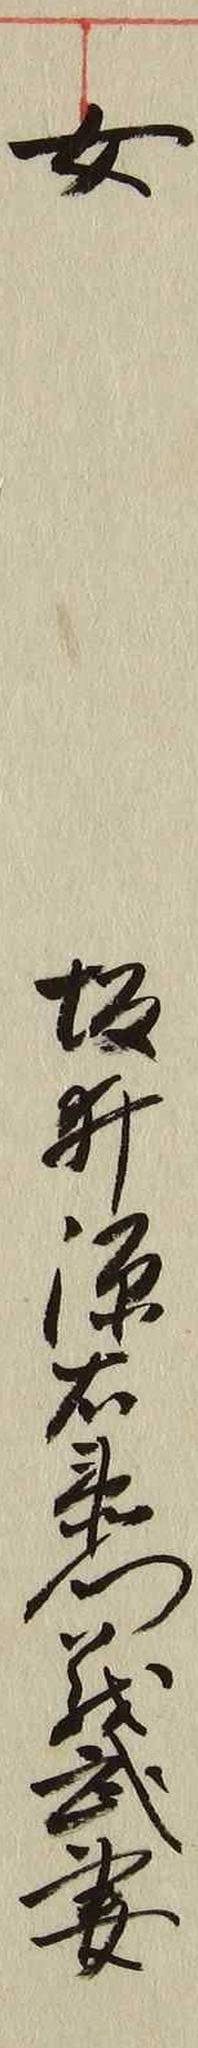女坂井源右衛門義武妻
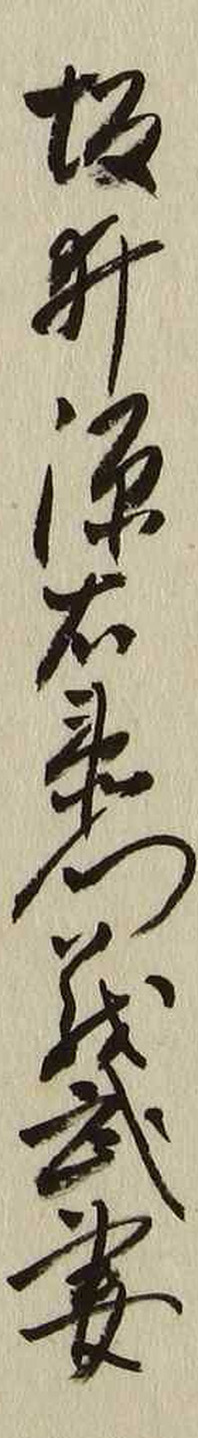女坂井源右衛門義武妻
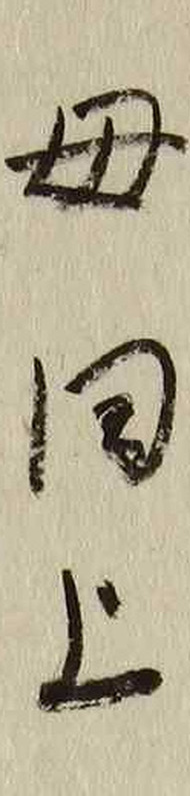母同上
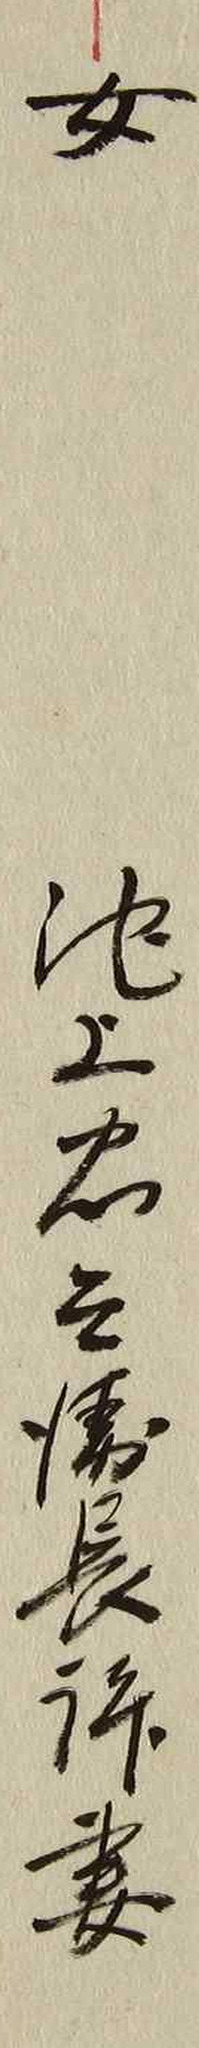女池上忠兵衛長許妻
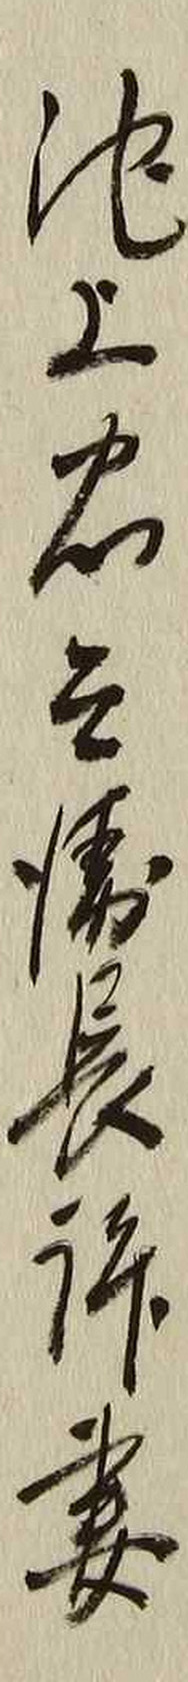女池上忠兵衛長許妻
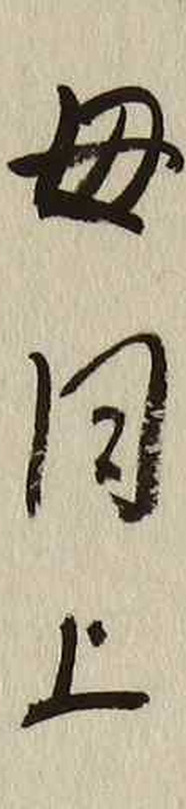母同上
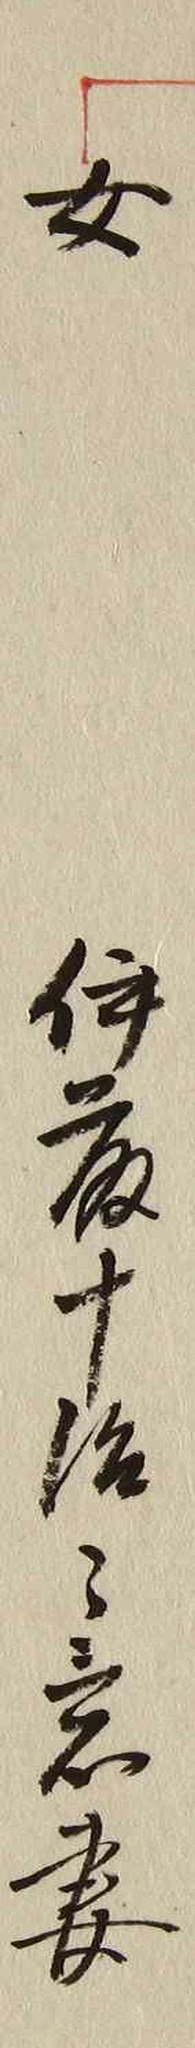女伊藤十治々意妻
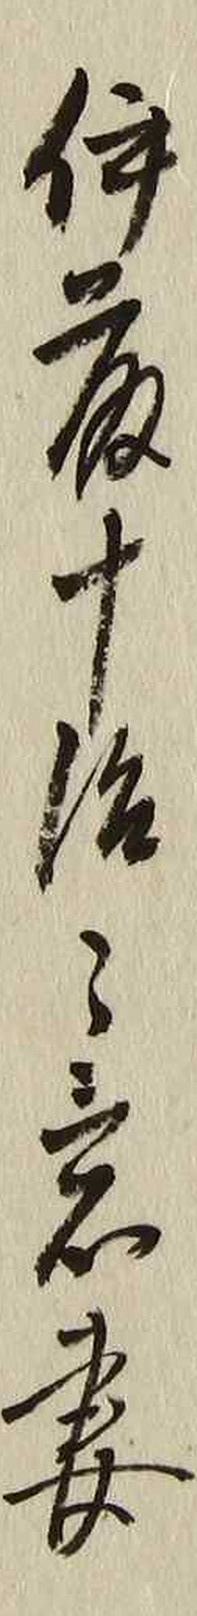女伊藤十治々意妻
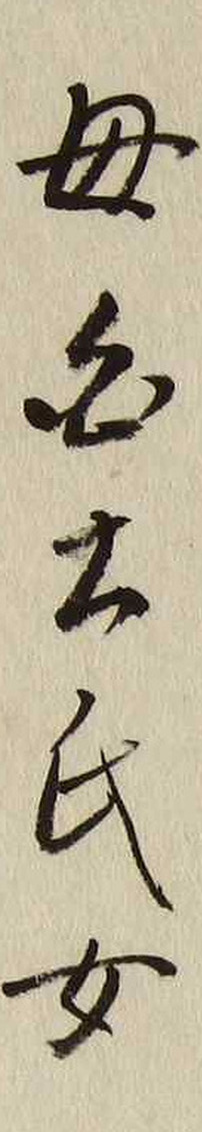母白土氏女

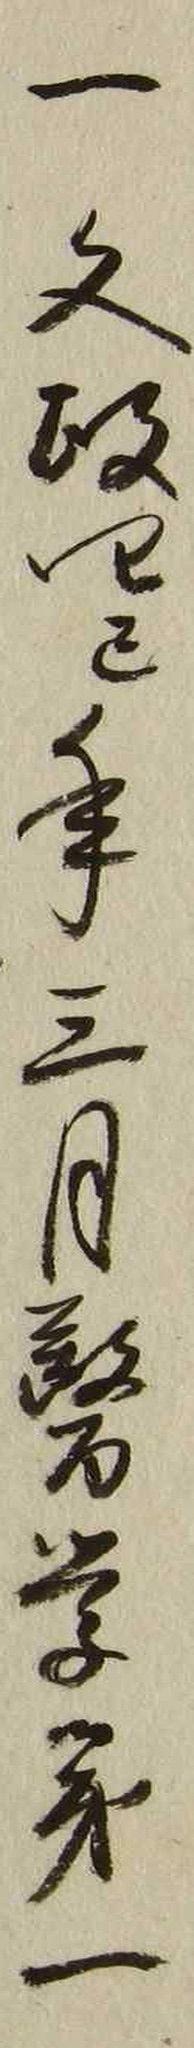一文政四巳年三月医学第一
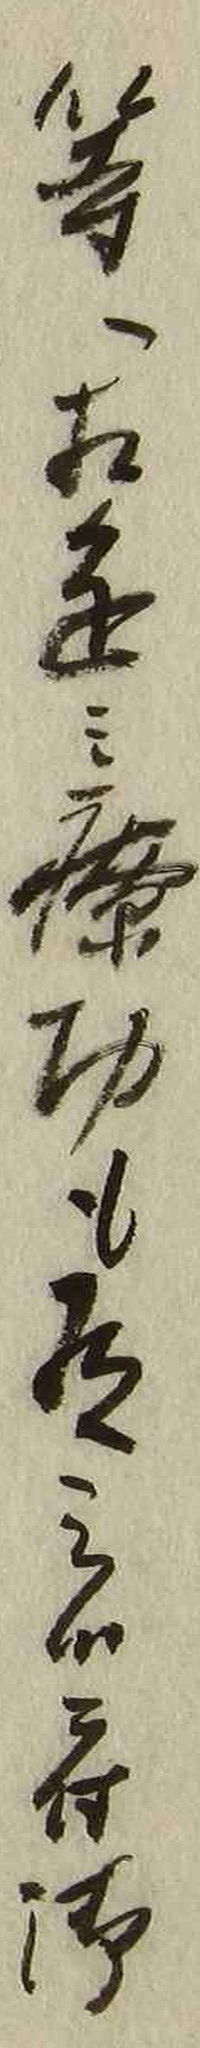等へ相進ミ療功も有之候ニ付御
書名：諸士系譜　巻之353　す之部3
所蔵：会津若松市立会津図書館
